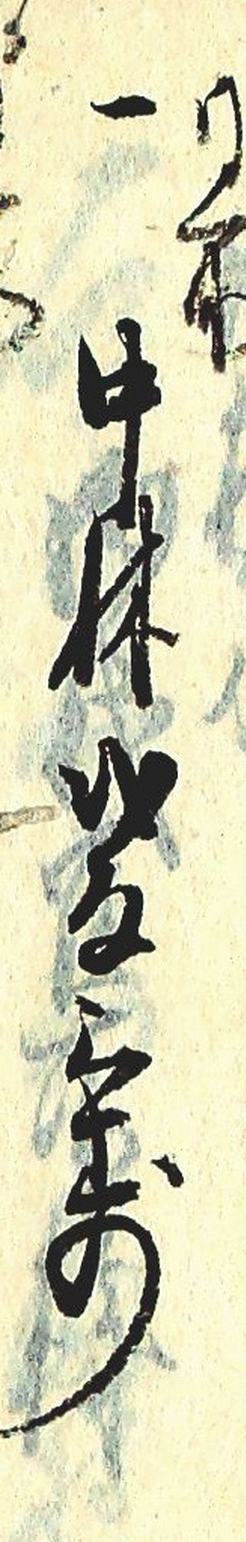一中林弐反三歩
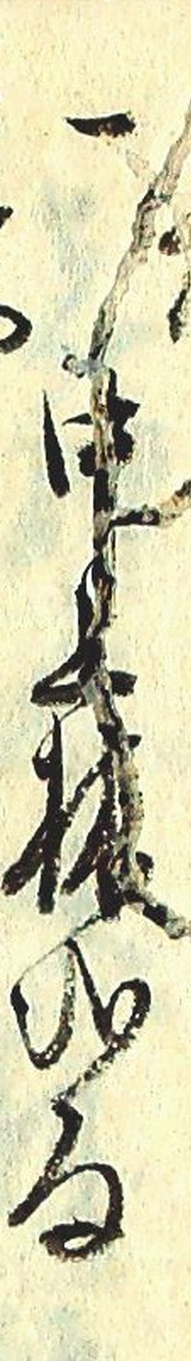一中上林弐反
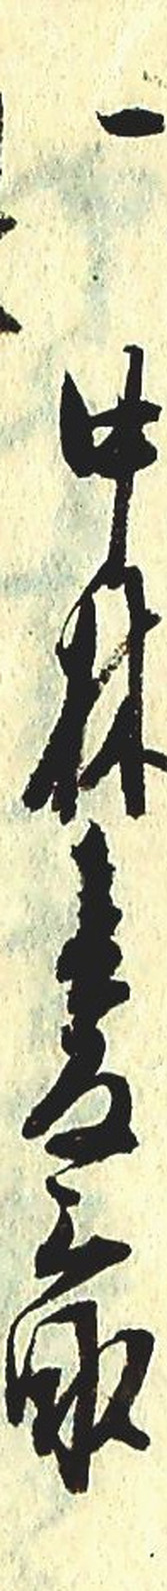一中林壱反三畝
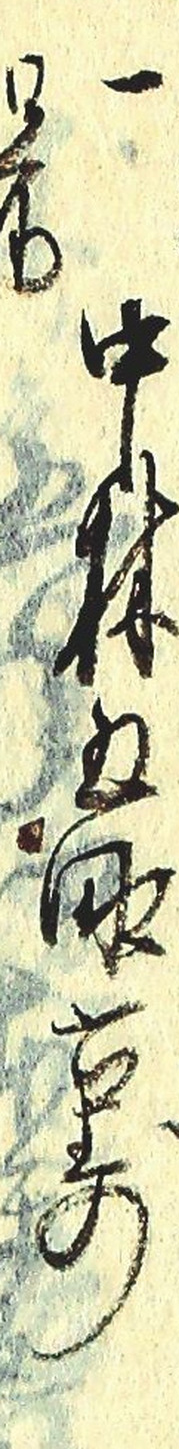一中林五畝六歩
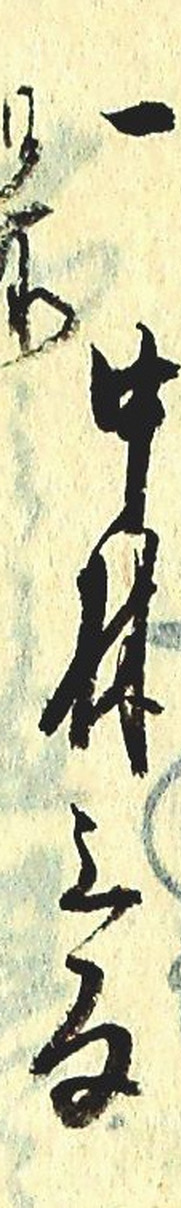一中林三反
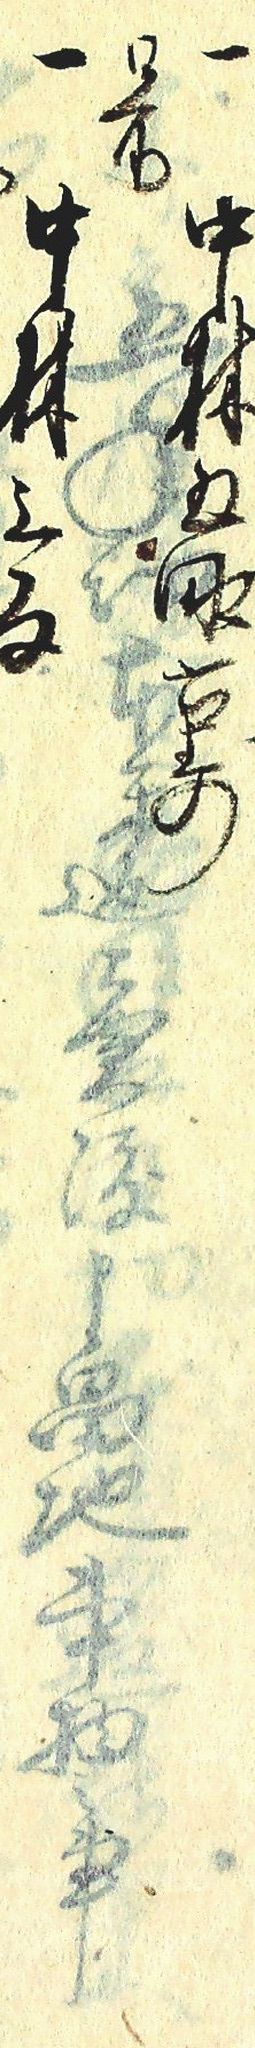一中林三反
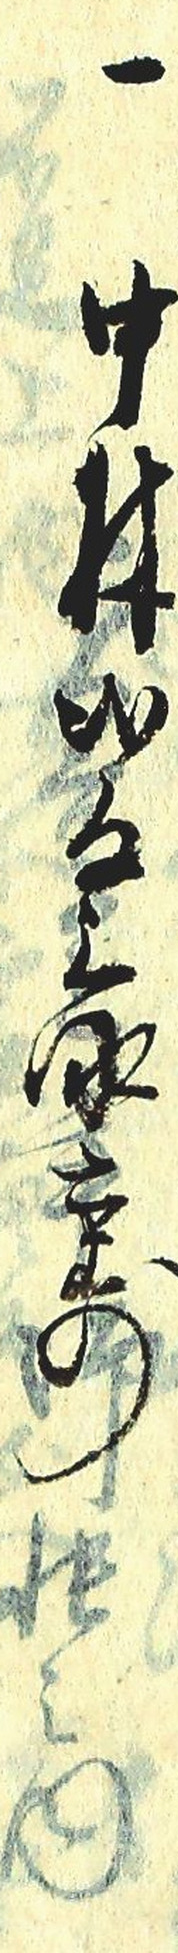一中林弐反三畝六歩
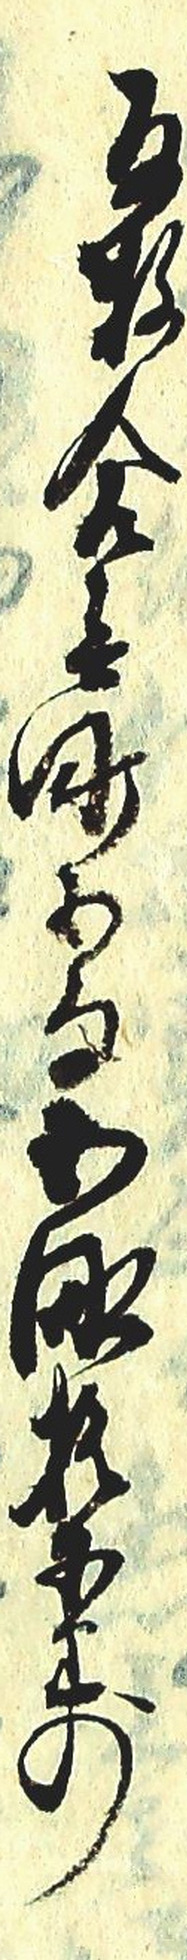反数合壱町五反五畝拾五歩
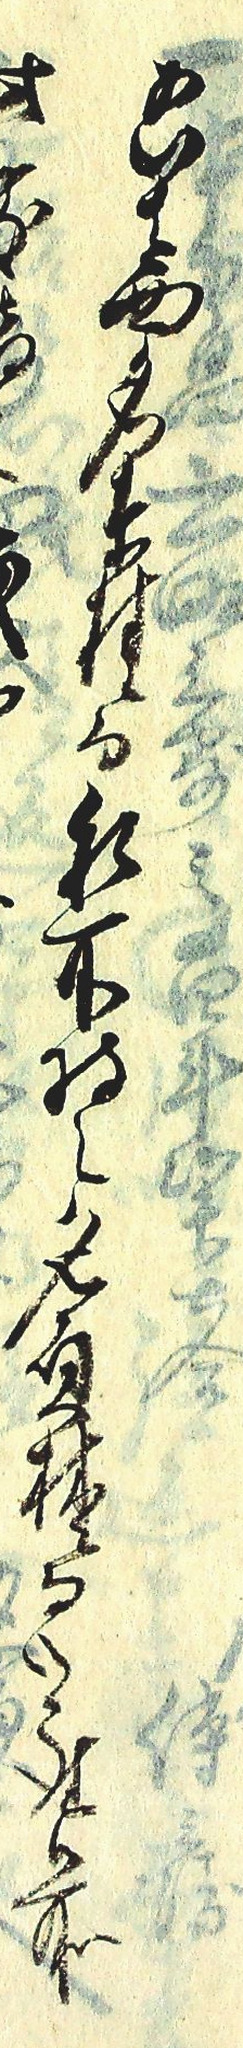右は西名東村にて私所持之名負林にて御座候所
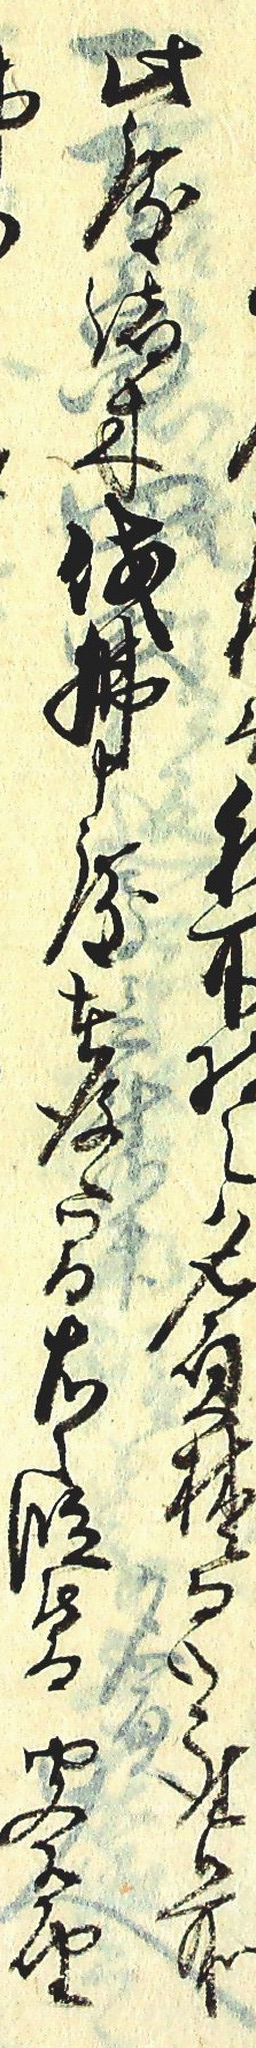此度諸木伐払申度奉存候間右之段被為聞召届
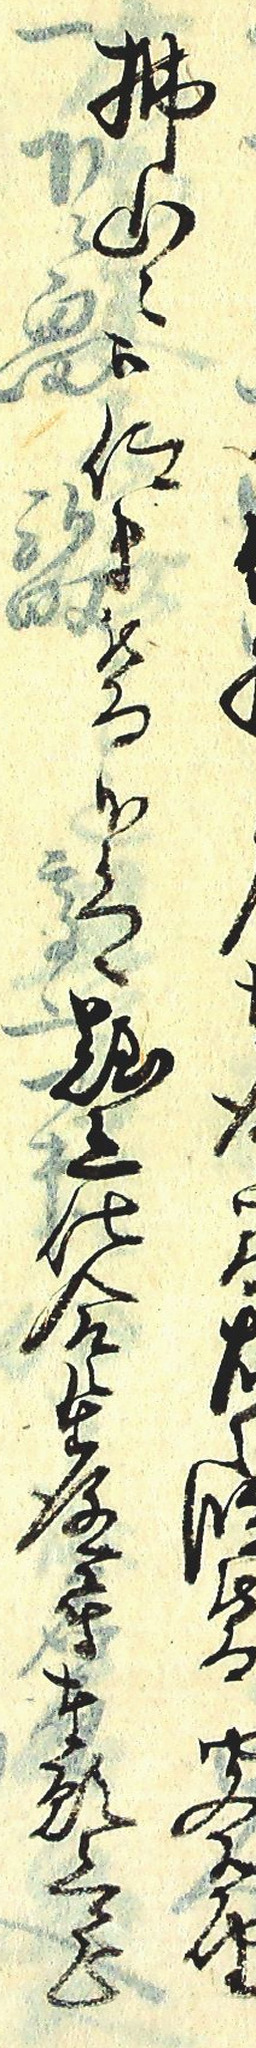払山に被仰付被為下候はゝ難有仕合に奉存候に付奉願上候以上
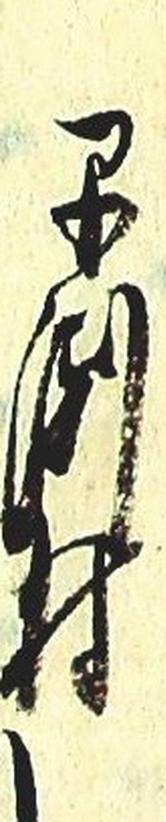早渕村
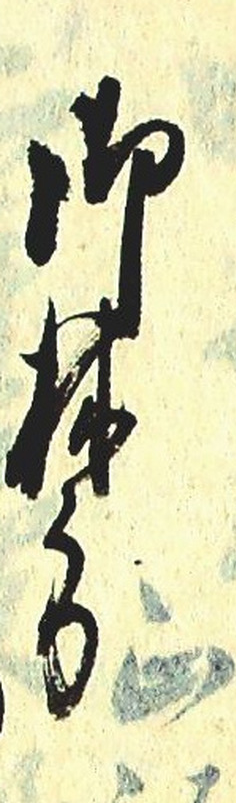御林方
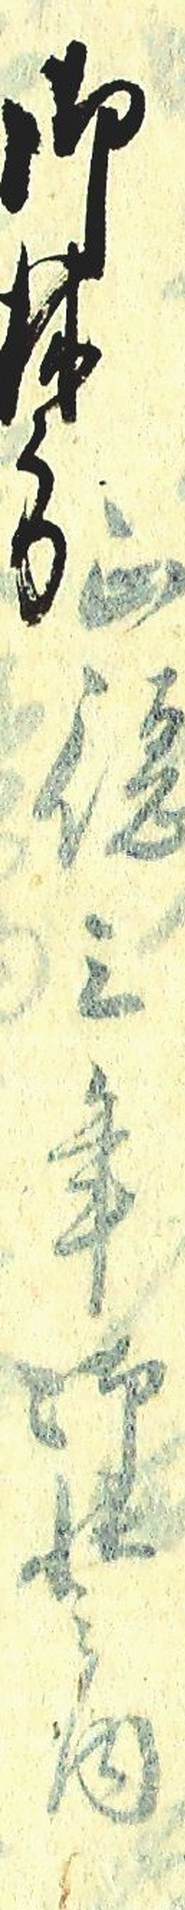御林方
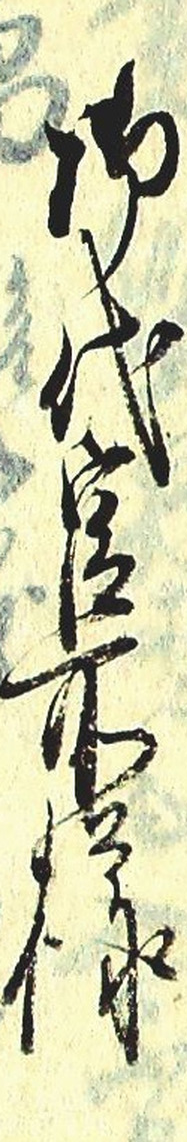御代官所様
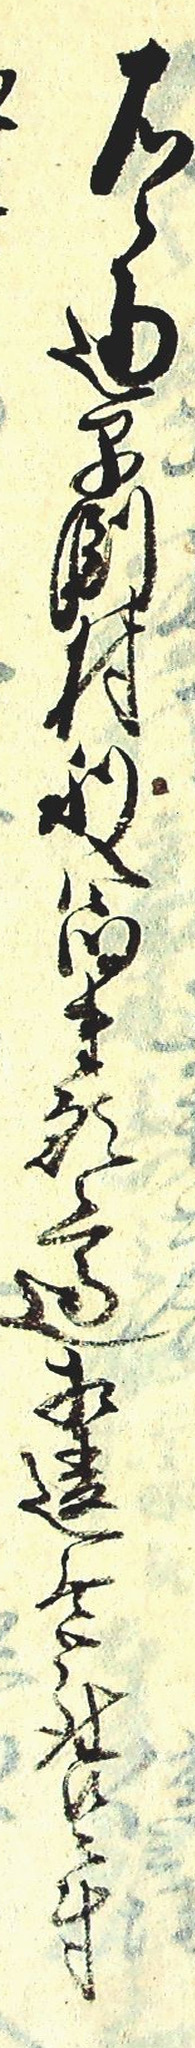右之通早淵村利八郎奉願上通相違無御座候に付
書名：諸御願書控(弐番）
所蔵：鳴門教育大学 Naruto University of Education
